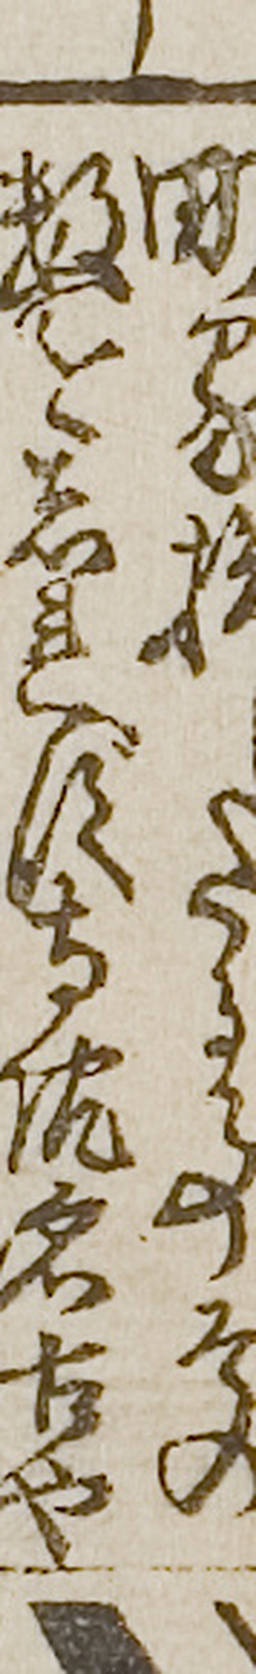数をしれず寺院名古や
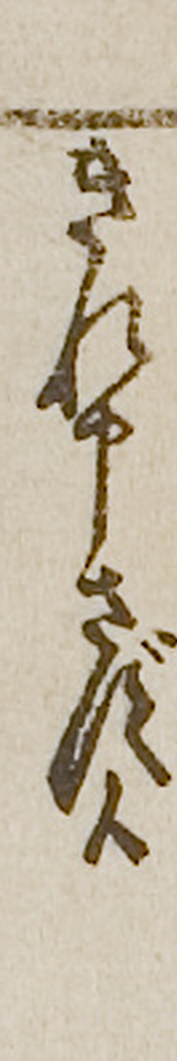きれ申さず候
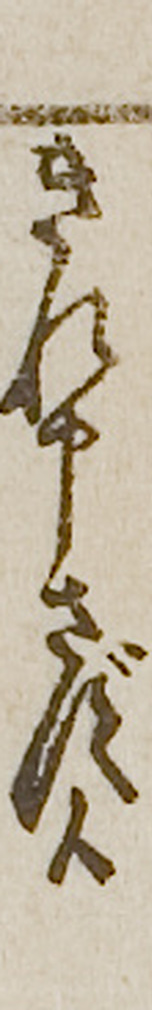きれ申さず候
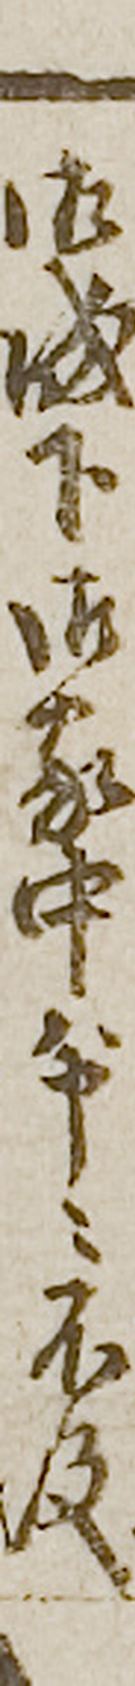御城下御家中は申に不及
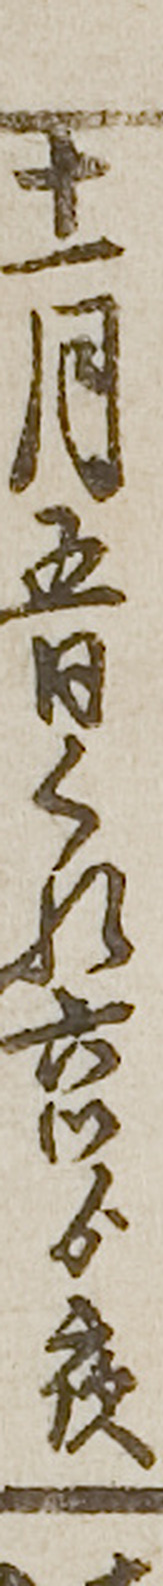十一月五日くれ六ツゟ夜
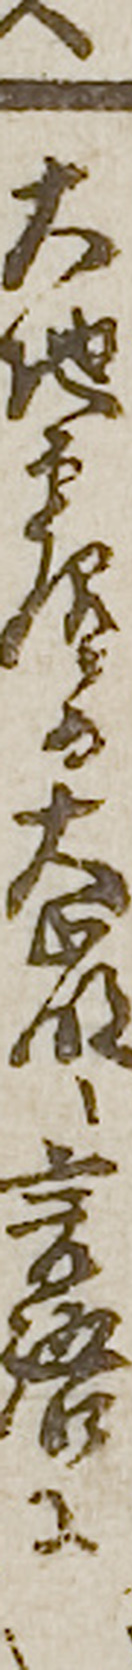大地震ニ而大崩し言語に
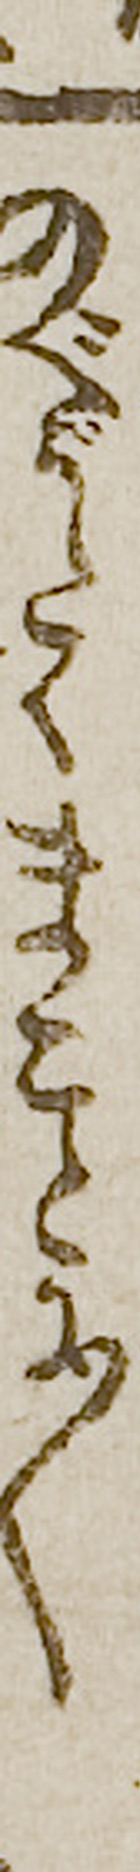のべがたくまことに〳〵
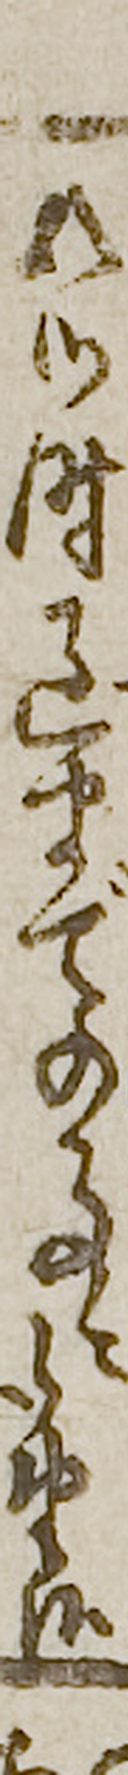八ツ時過までの事に御坐候
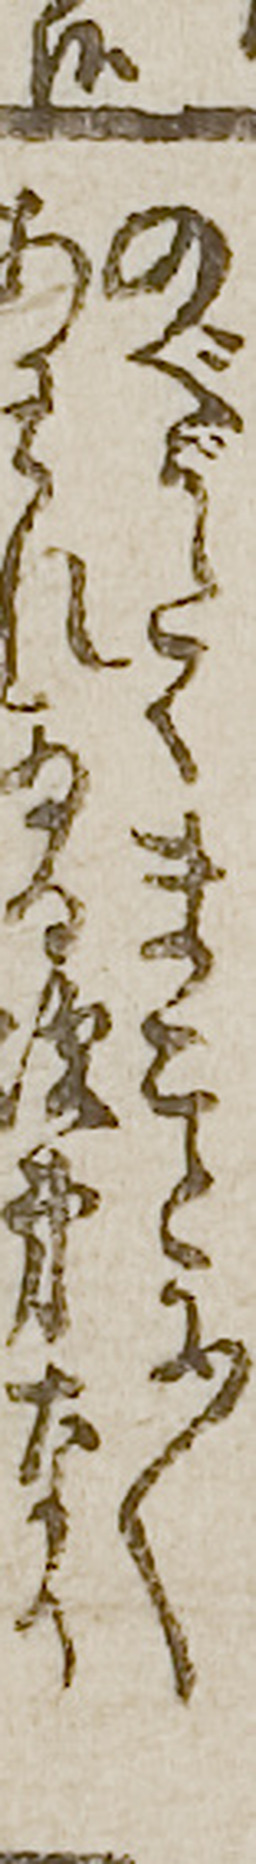あわれなる次第なり
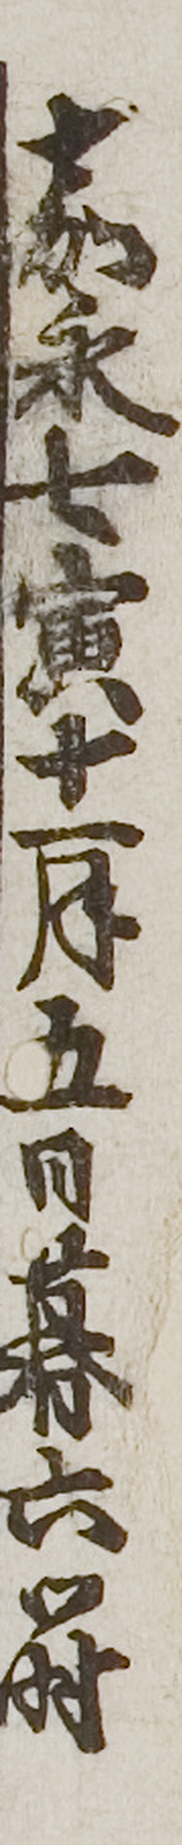嘉永七甲寅十一月四日五ツ半時ゟ
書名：諸国大地震大津波 三編
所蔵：東京大学総合図書館 General Library in the University of Tokyo, JAPAN
